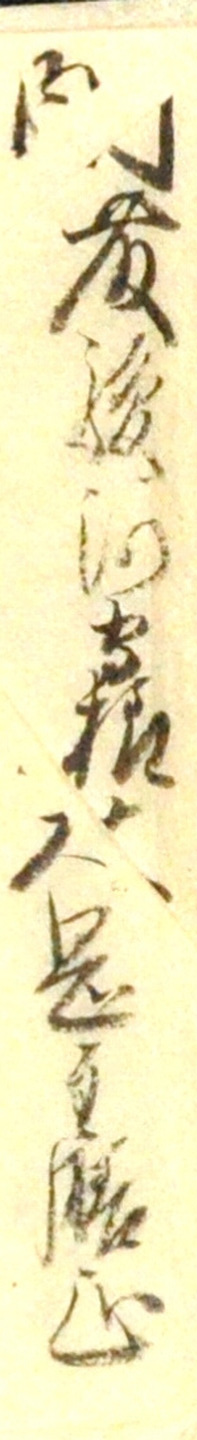内藤駿河守様大岡主膳正

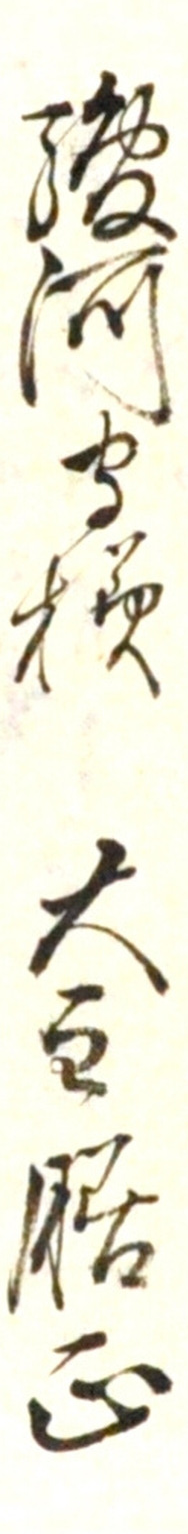駿河守様大主膳正

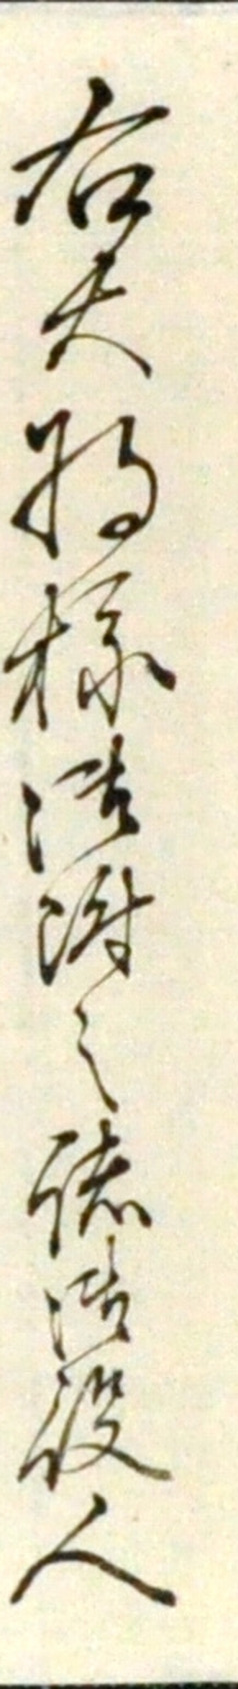右大将様御附之諸御役人
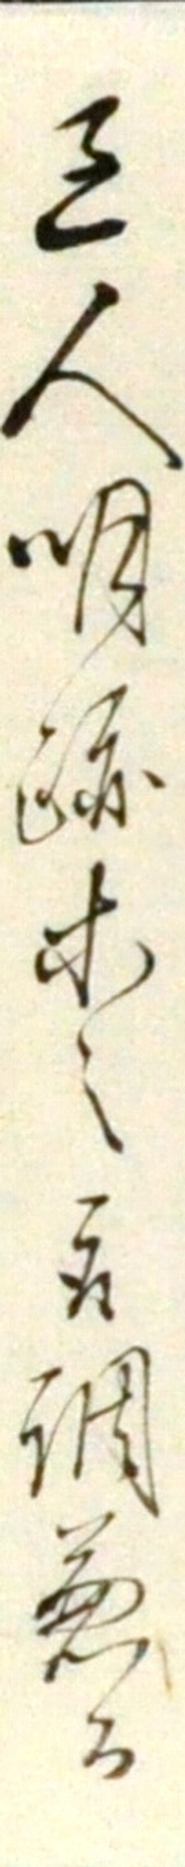過人明跡等之取調兼て
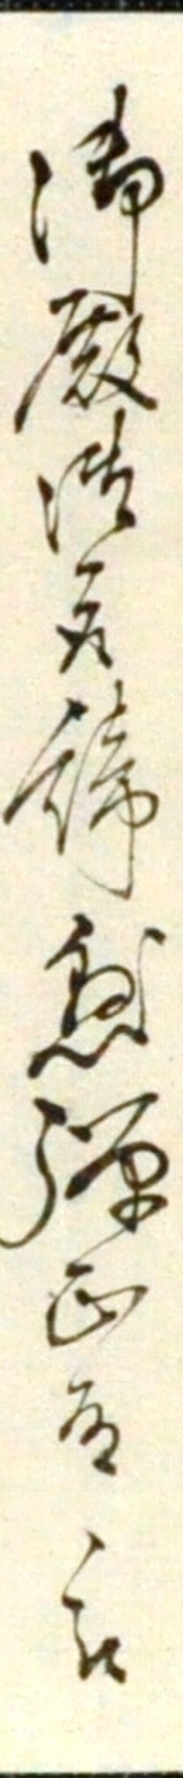御殿御取締懸弾正殿被
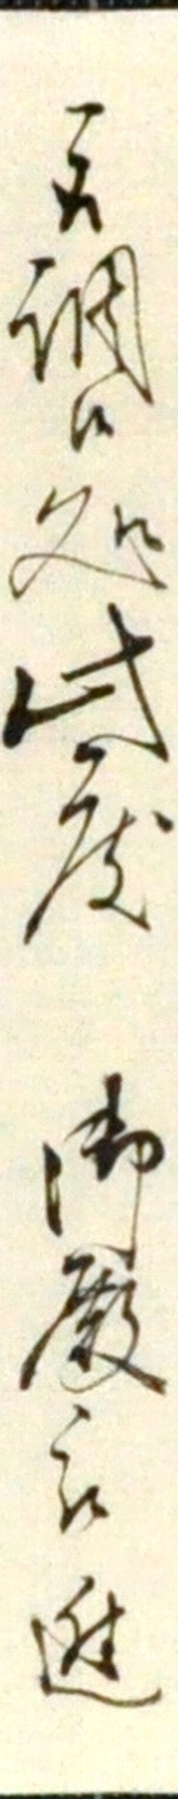取調候処此度御殿被進
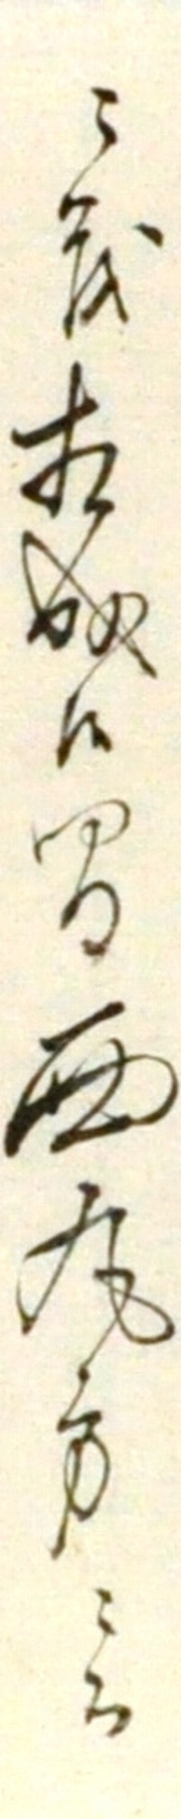にも相成候間西丸方にて
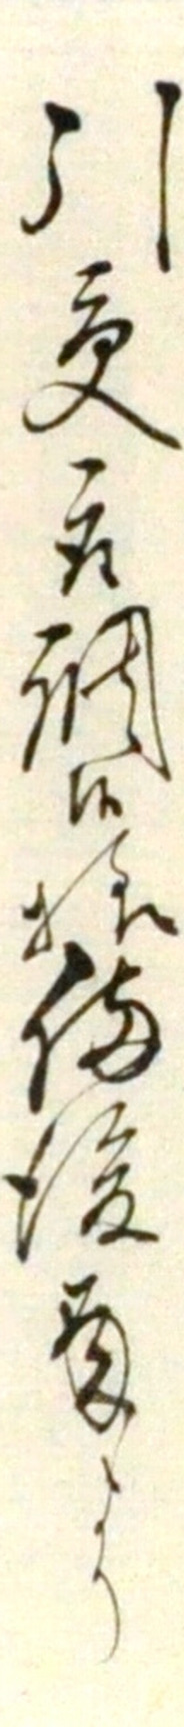引受取調候様備後殿より
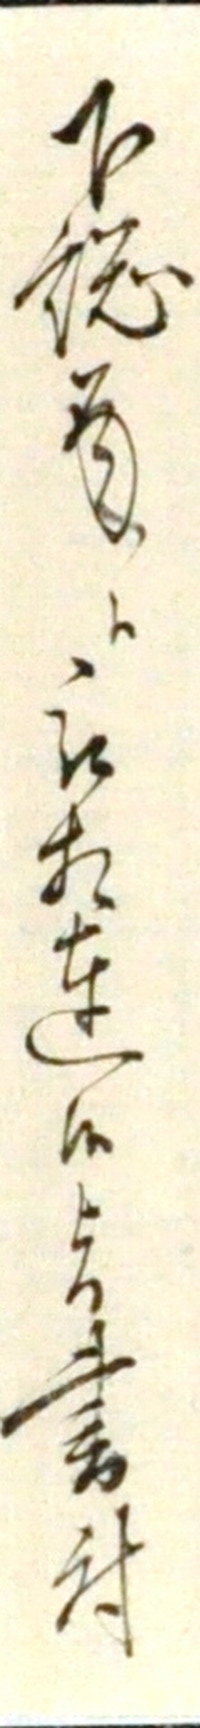下総殿え被相達候旨書付
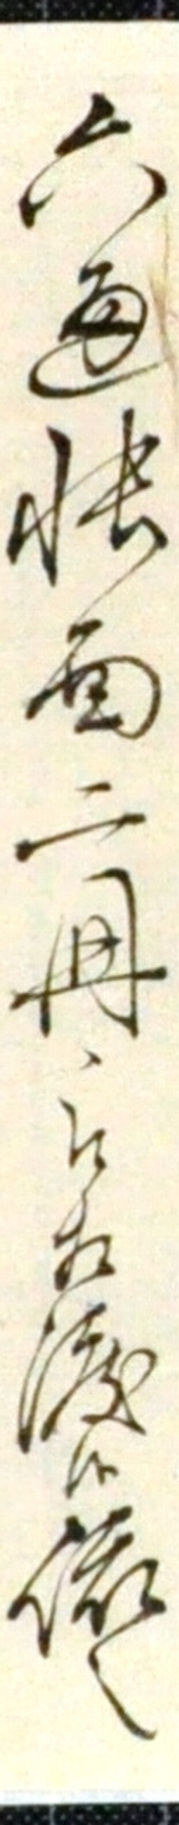六通帳面二冊被相渡候依之
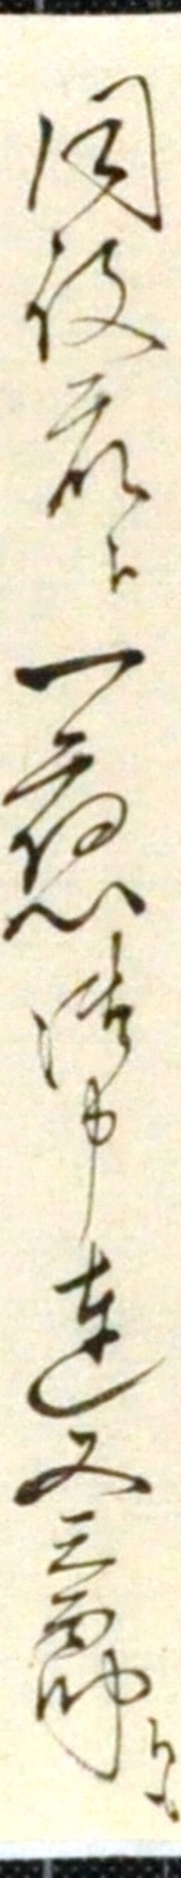同役衆え一応御申達又三郎えも
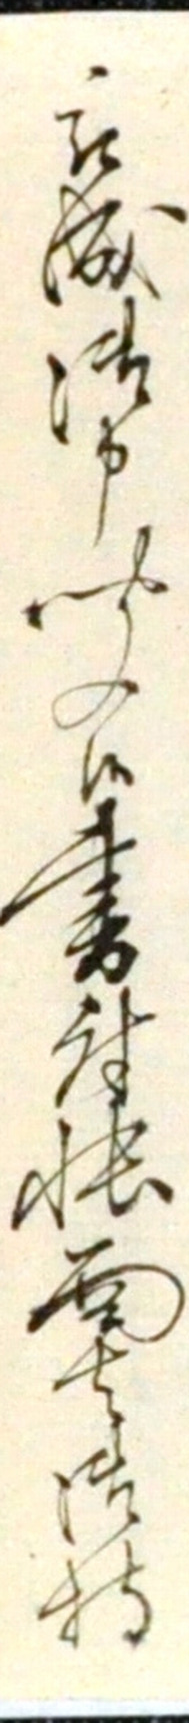被成御申聞候書付帳面は御持
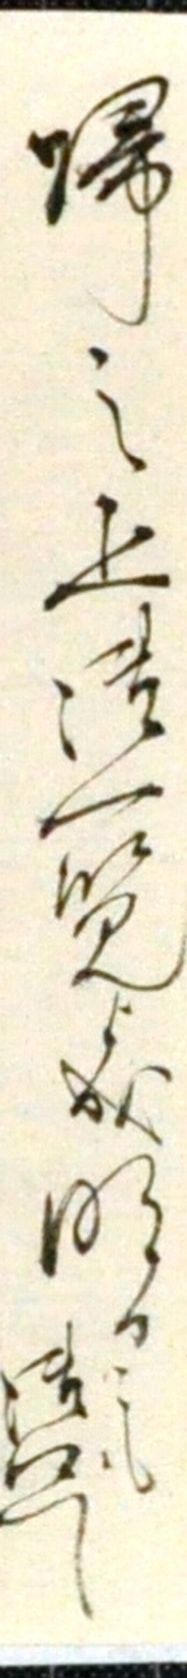帰之上御一覧被成明日にも御廻し
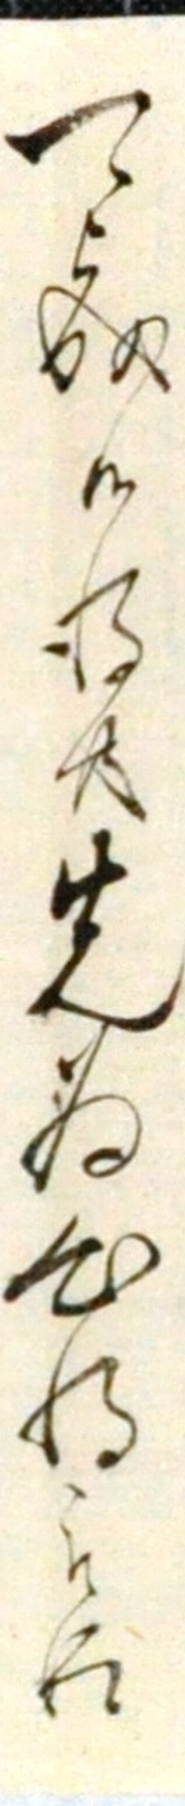可被成候得共先為心得被仰
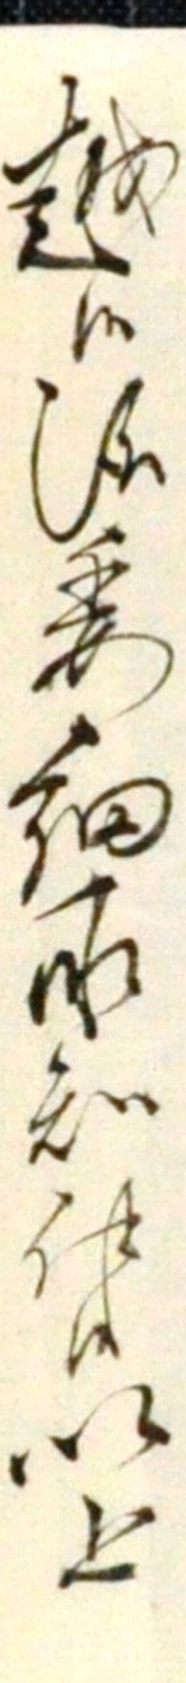越候趣委細承知仕候以上
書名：書状
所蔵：伊那市立高遠町図書館・合同会社AMANE
